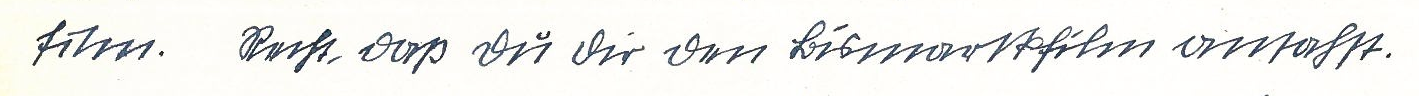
film. Recht, daß Du Dir den Bismarkfilm ansahst.
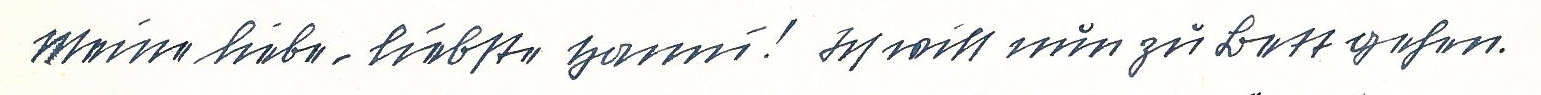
Meine liebe, liebste ! Ich will nun zu Bett gehen.
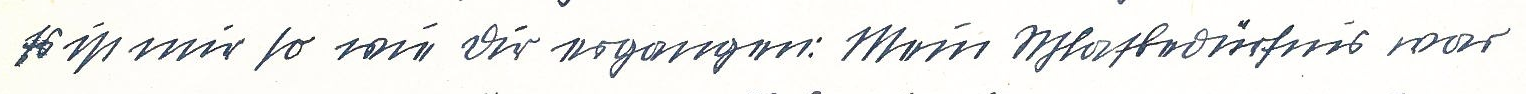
Es ist mir so wie Dir ergangen: Mein Schlafbedürfnis war
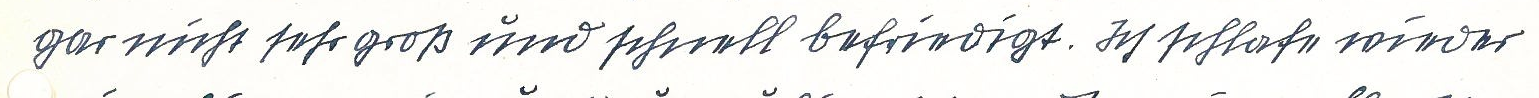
gar nicht sehr groß und schnell befriedigt. Ich schlafe wieder
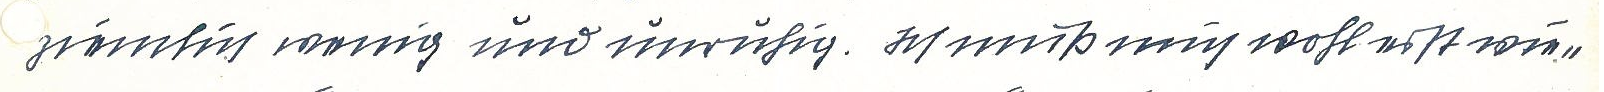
ziemlich wenig und unruhig. Ich muß mich wohl erst wie¬
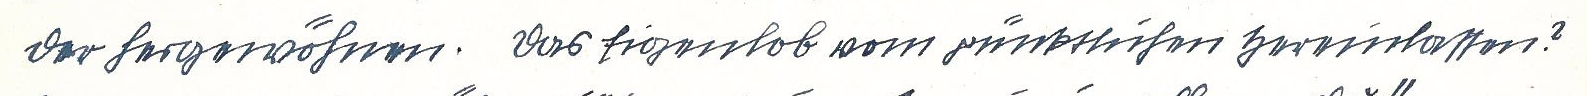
der hergewöhnen. Das Eigenlob vom pünktlichen Hereinlassen?
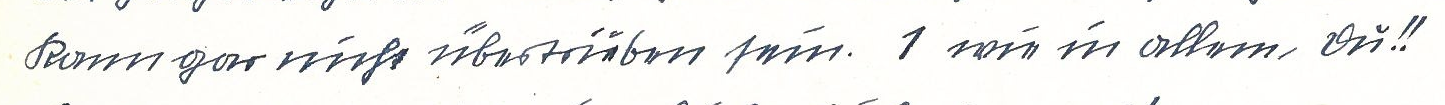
Kann gar nicht übertrieben sein. 1 wie in allem, Du!!
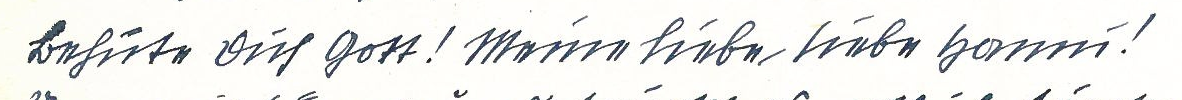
Behüte Dich Gott! Meine liebe, liebe !
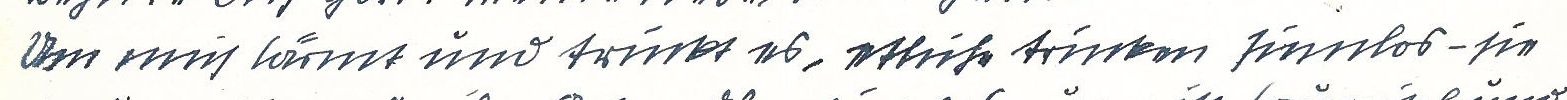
Um mich lärmt und trinkt es, etliche trinken sinnlos – sie
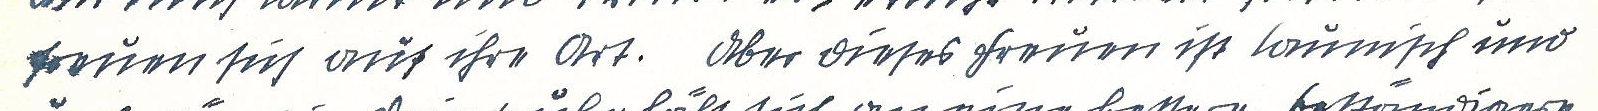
freuen sich auf ihre Art. Aber dieses Freuen ist launisch und
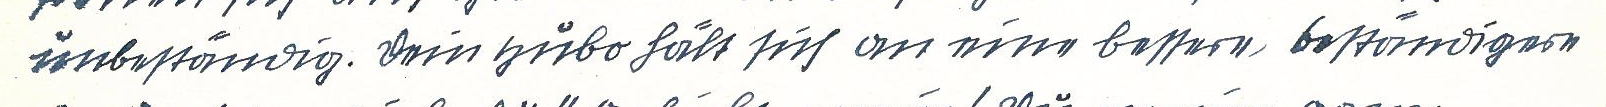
unbeständig. Dein Hubo hält sich an eine bessere, beständigere
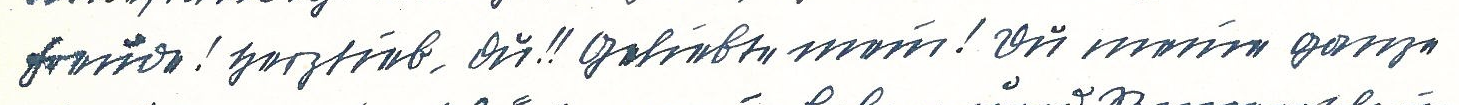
Freude! Herzlieb, Du!! Geliebte mein! Du meine ganze
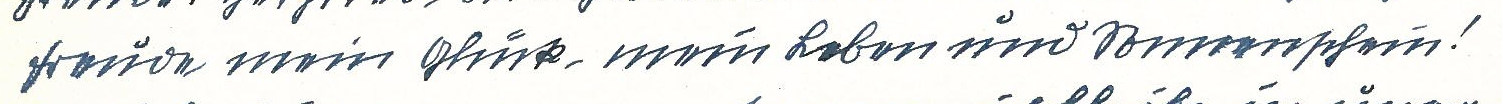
Freude, mein Glück, mein Leben und Sonnenschein!
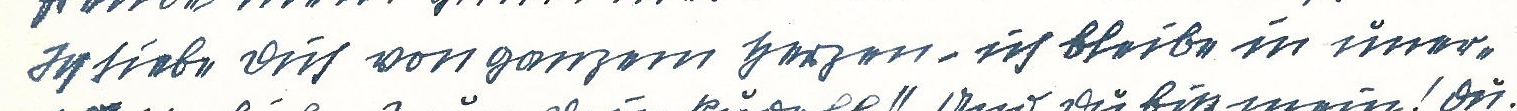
Ich liebe Dich von ganzem Herzen, ich bleibe in uner¬
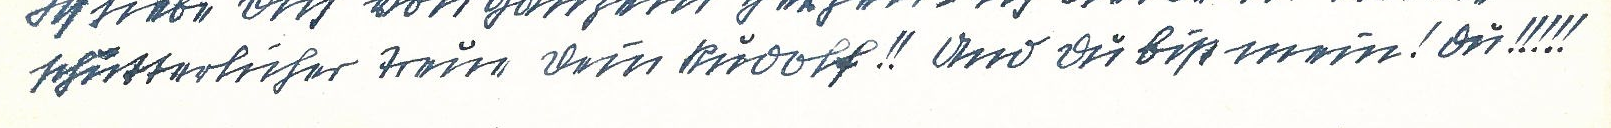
schütterlicher Treue Dein [Roland]!! Und Du bist mein! Du!!!!!
